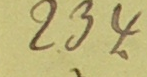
234
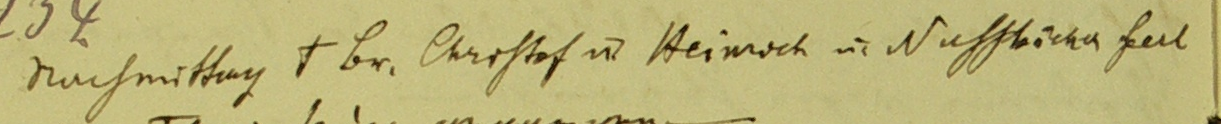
Nachmittag mit Br. Christof und Heinrich und Nussbächer Fred,
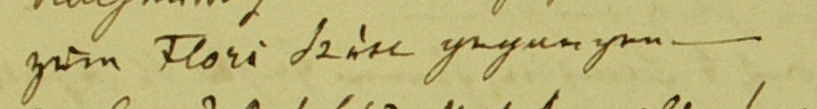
zum Flori Szasz gegangen.—
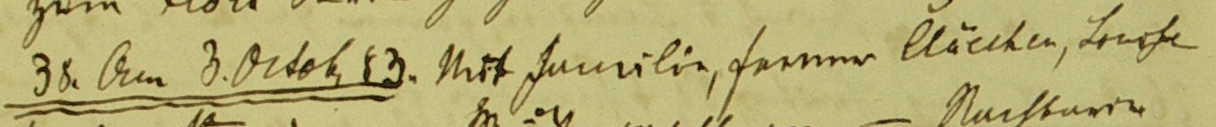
38) Am 3. Oktob. 83. Mit Familie, ferner Clärchen, Louise
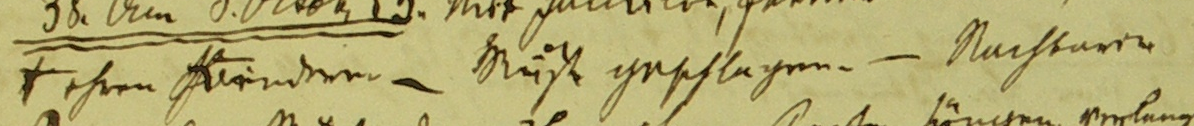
mit Ihren Kindern,--Nüße geschlagen.- Nachbaren
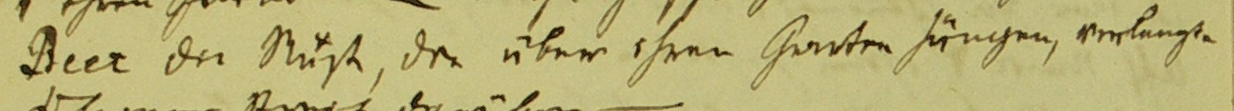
Beer die Nüße, die über ihren Garten hingen, verlangt.
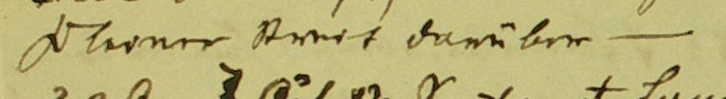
Kleiner Streit darüber.—
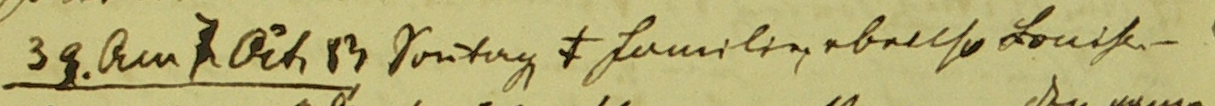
39) Am7 Okob. 83 Sonntag mit Familie, ebenso Louise.
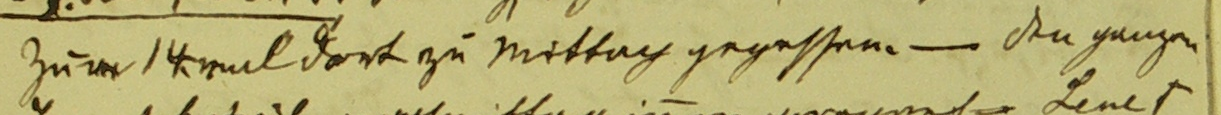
Zum 14. mal dort zu Mittag gegessen - Am ganzen
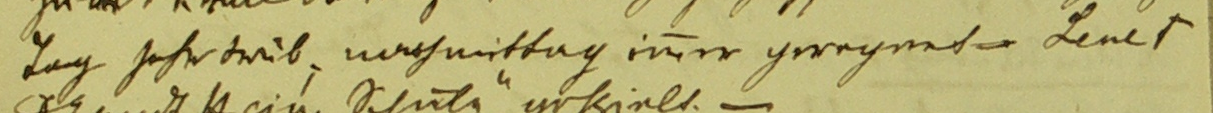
Tag sehr trüb, nachmittag immer geregnet - Lene mit
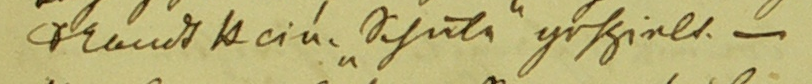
Draudt Heinr. „Schule“ gespielt.
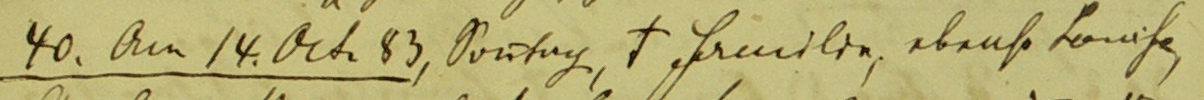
40) Am 14. Oktob. 83 Sonntag, mit Familie, ebenso Louise,
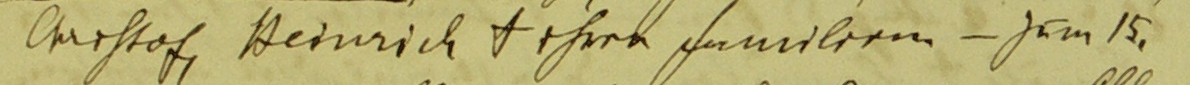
Christof, Heinrich mit Ihren Familien - Zum 15.
